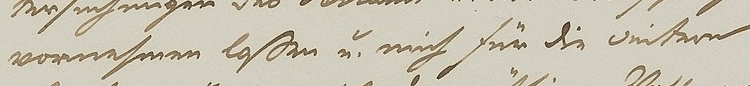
vornehmen laßen u. mich für die weitern
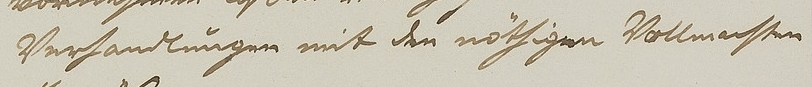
Verhandlungen mit den nöthigen Vollmachten
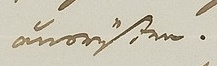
ausrüsten.
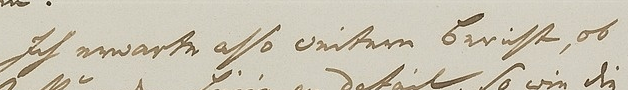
Ich erwarte also weitern Bericht, ob
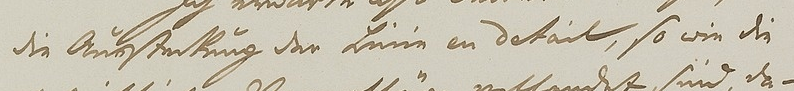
die Aussteckung der Linie en detail, so wie die
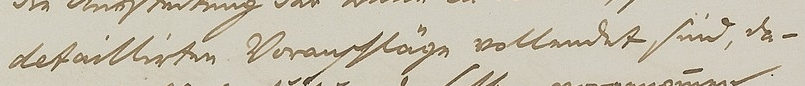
detaillirten Voranschläge vollendet sind, da-
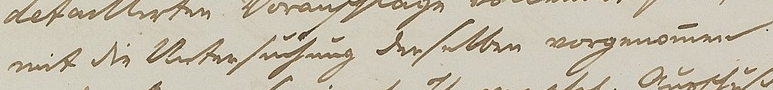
mit die Untersuchung derselben vorgenommen
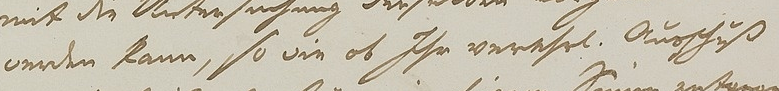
werden kann, so wie ob Ihr verehrl. Ausschuß
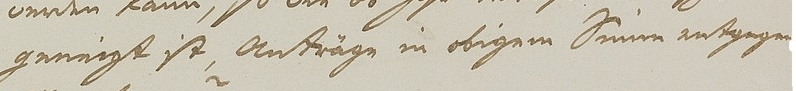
geneigt ist, Anträge in obigem Sinne entgegen
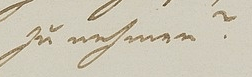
zu nehmen?
